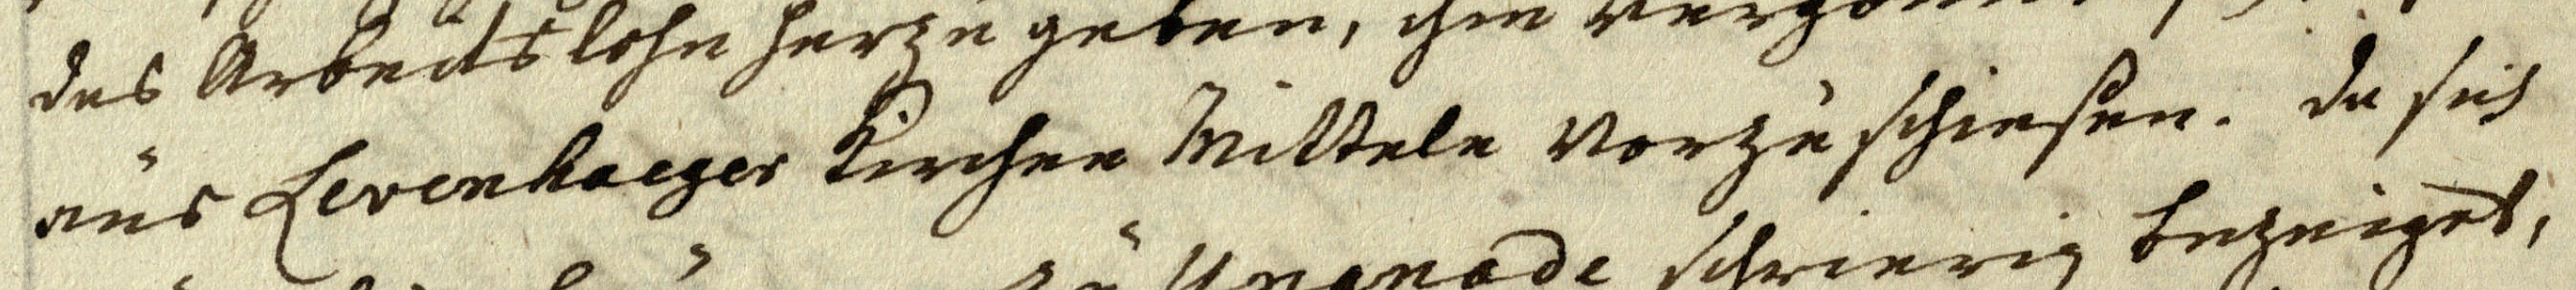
aus Levenhaeger Kirchen Mitteln vorzuschießen. da sich
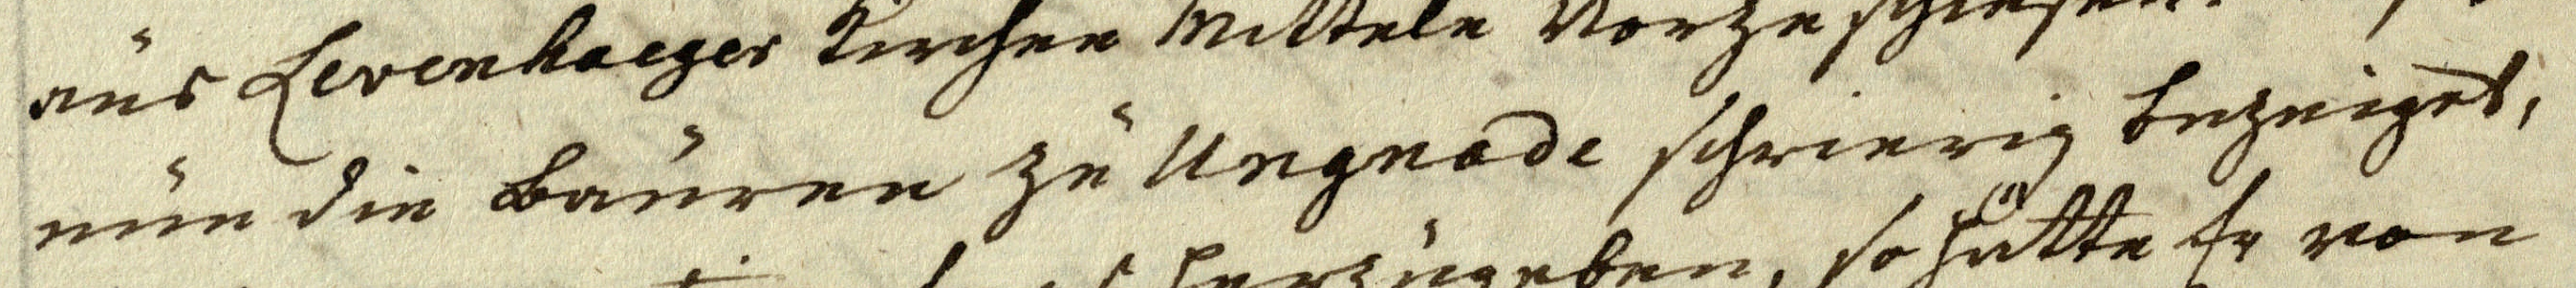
nun die Bauren zu Ungnade schwierig bezeiget,
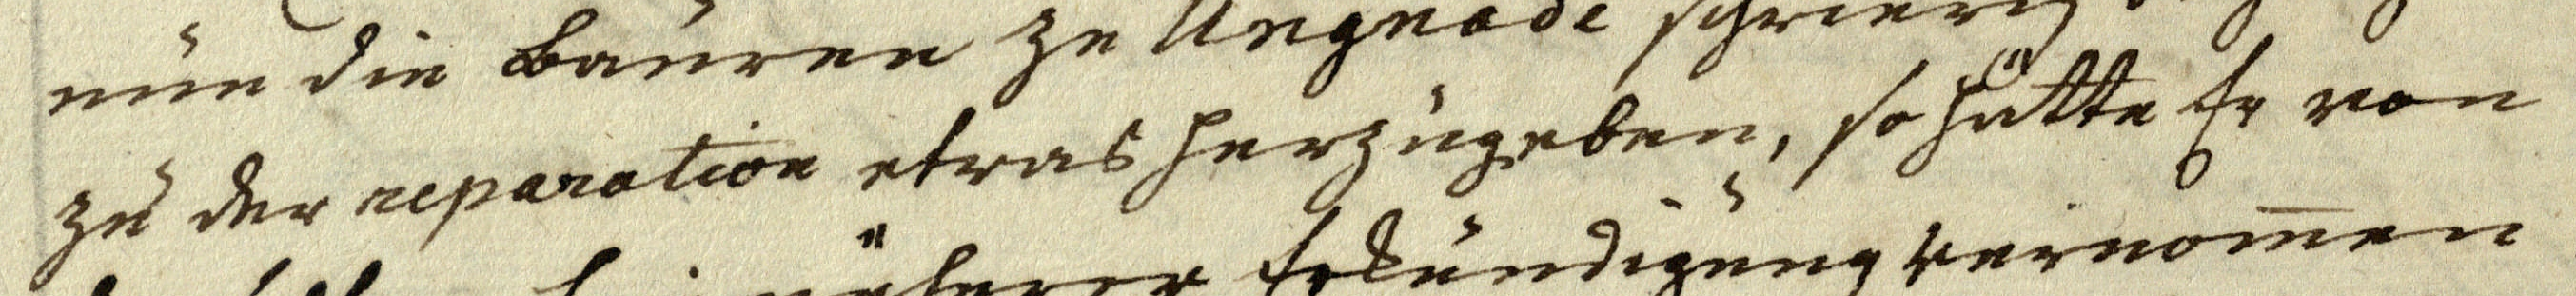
zu der reparation etwas herzugeben, so hätte Er von
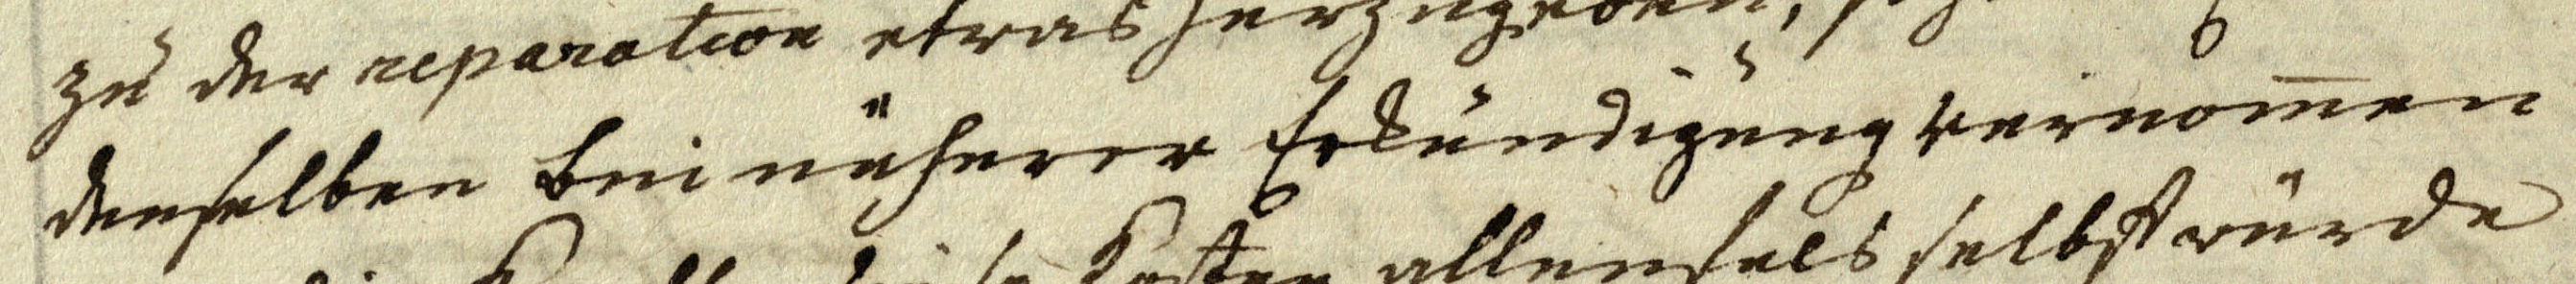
derselben bei näherer Erkundigung vernomen,
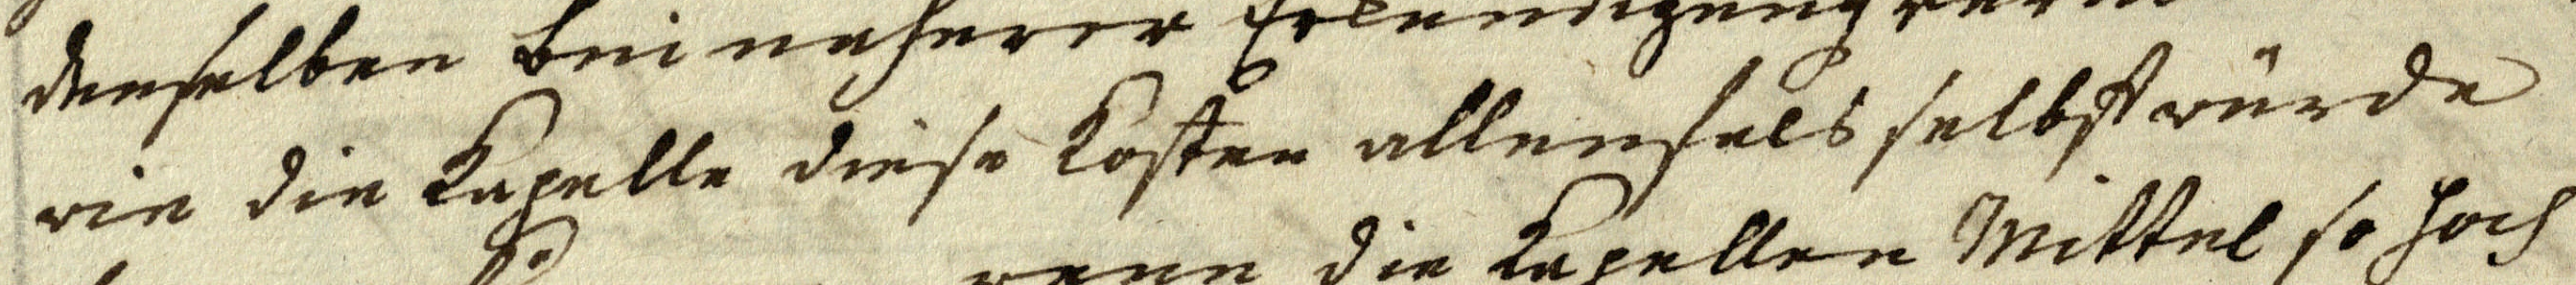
wie die Kapelle diese Kosten allenfals selbst würde
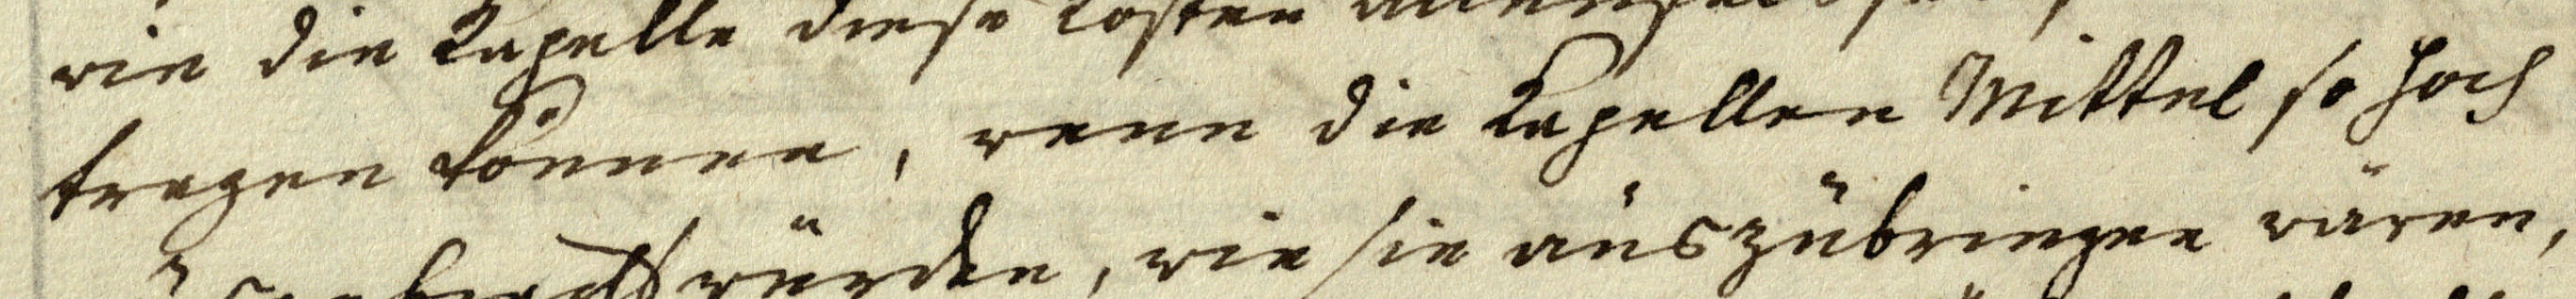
tragen können, wenn die Kapellen Mittel so hoch
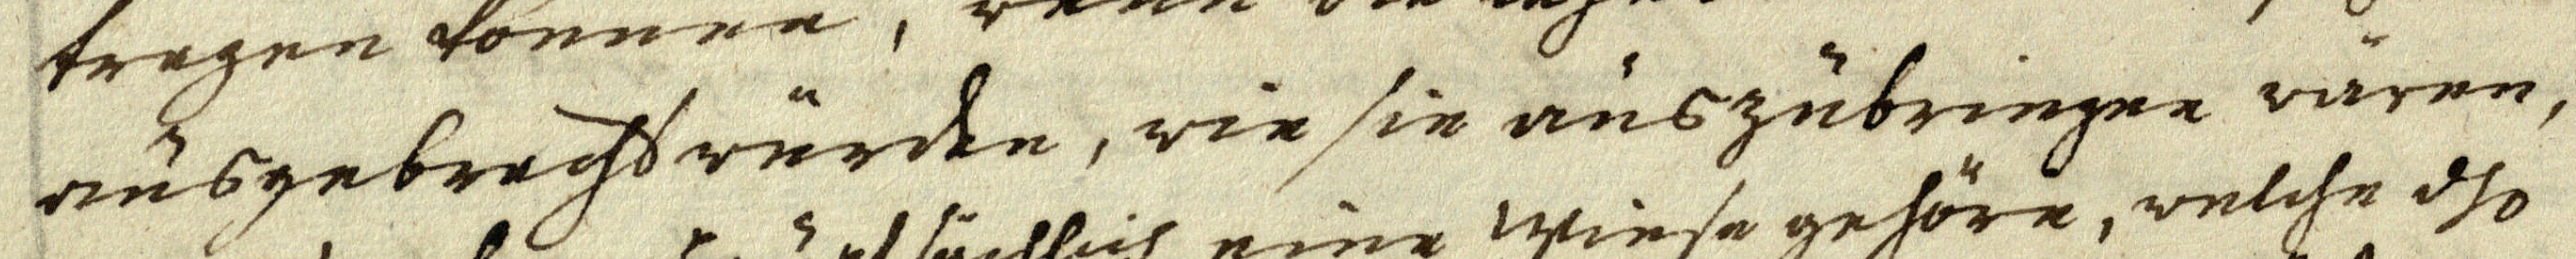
ausgebracht würden, wie sie auszubringen wären,
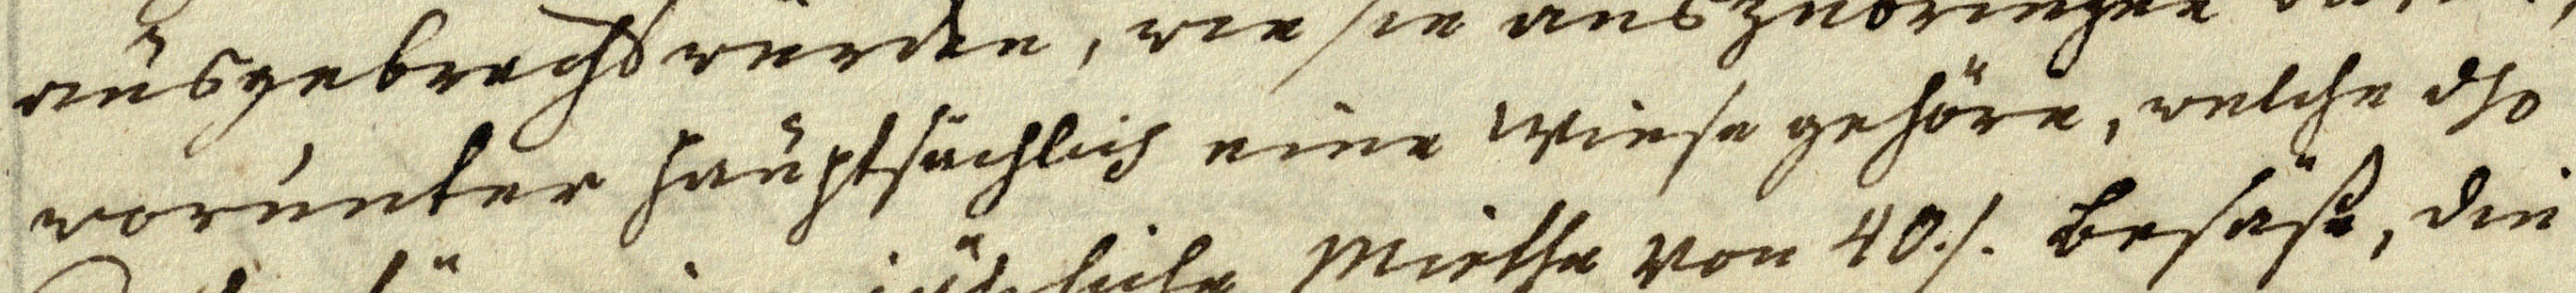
worunter hauptsächlich eine Wiese gehöre, welche dh.
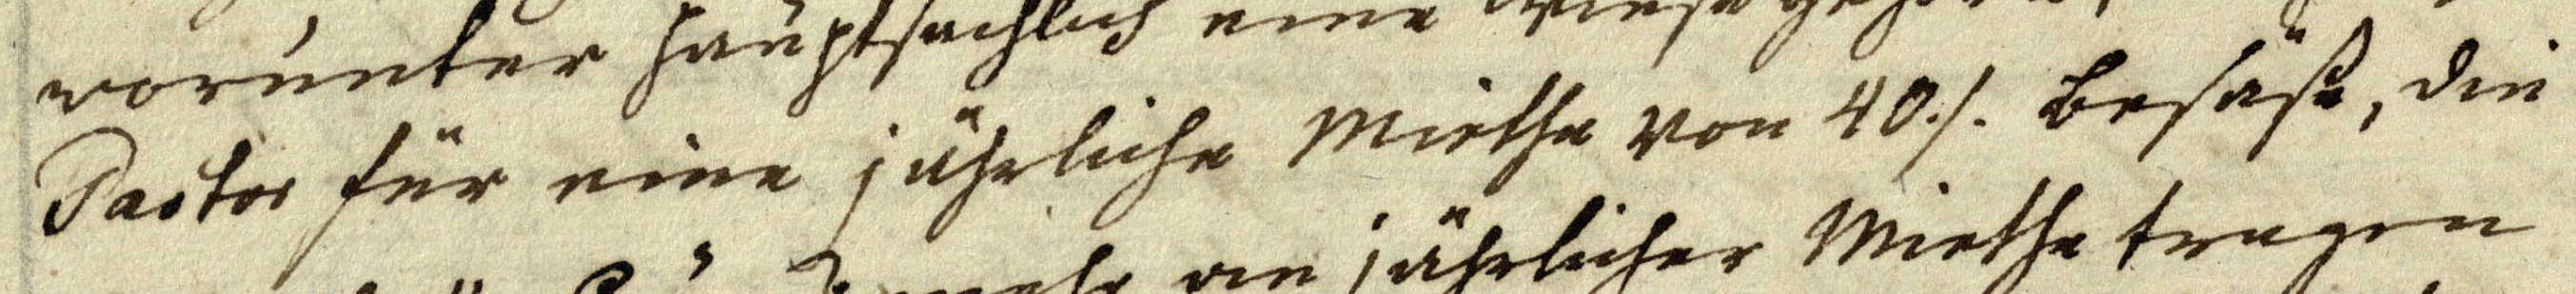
Pastor für eine jährliche Miethe von 40.s. besäße, die
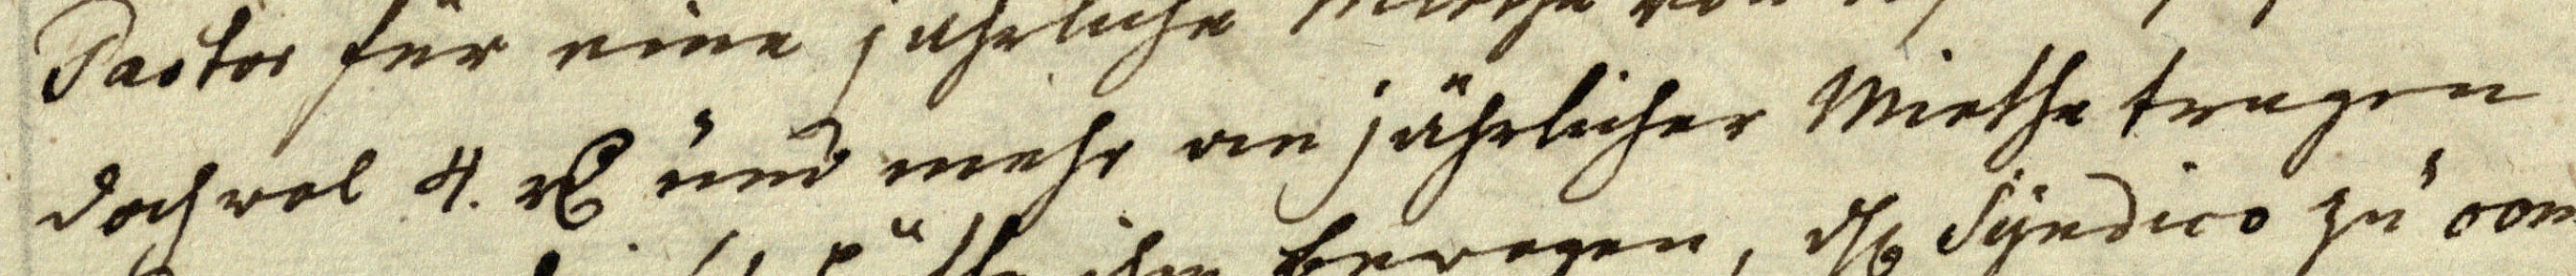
doch wol 4 rl. und mehr an jährlicher Miethe tragen
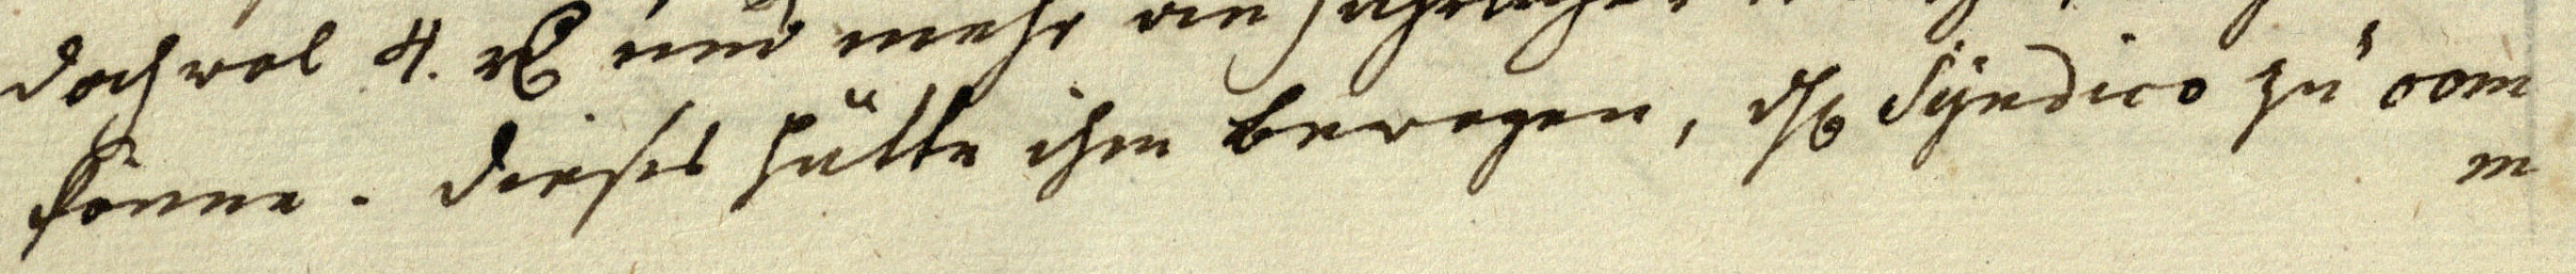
könne. Dieses hätte ihm bewogen, dh. Sÿndico zu com
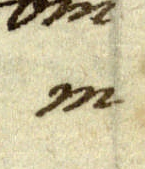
m
